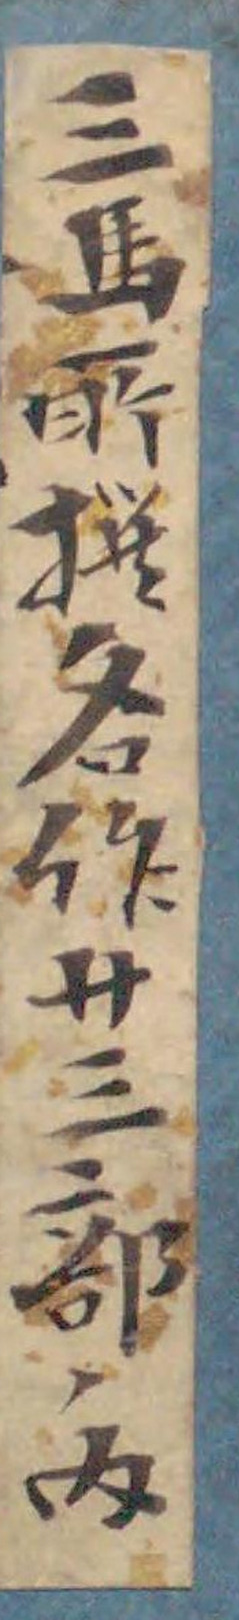三馬所撰各作廿三部ノ内

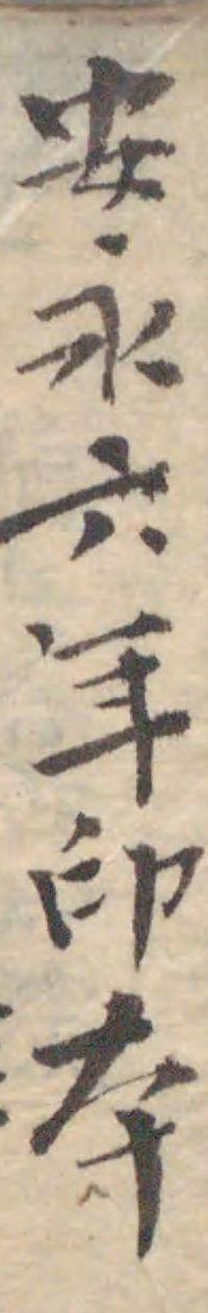安永六年印本
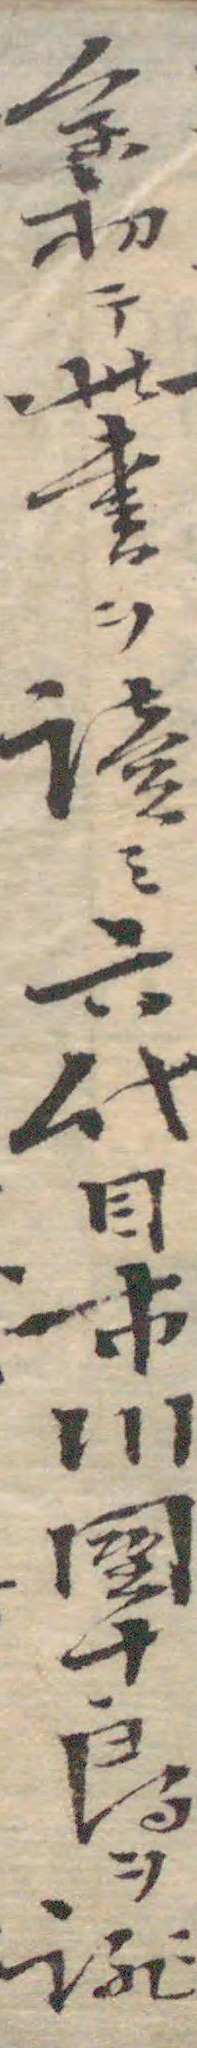余初テ此書ヲ読ミ六代目市川団十郎ヲ誹
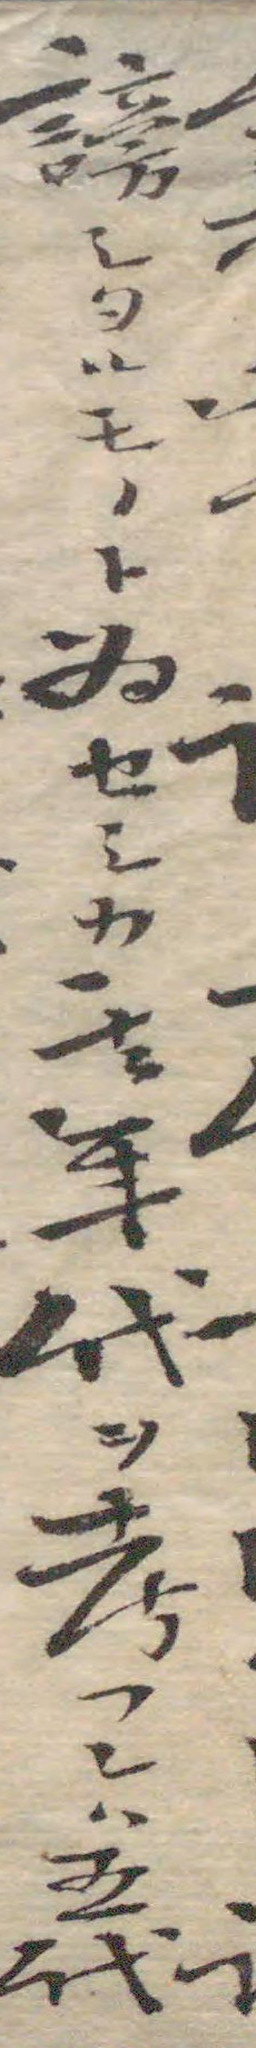謗シタルモノト為セシカ其年代ヲ考フレハ五代
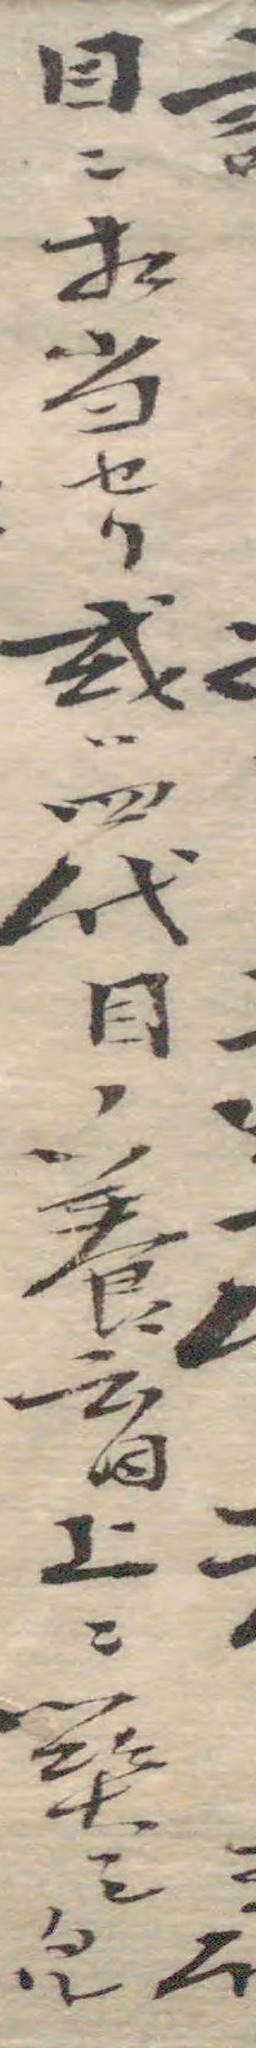目ニ相当セリ或ハ四代目ノ養育上ニ関シタル
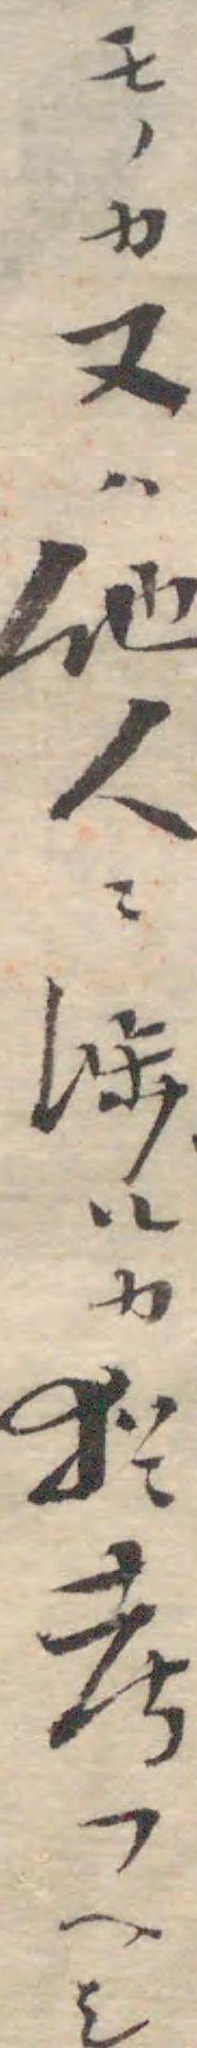モノカ又ハ他人ニ渉ルカ猶考フヘシ

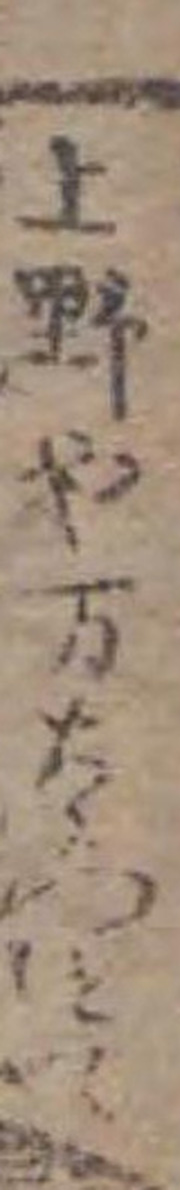上野や万右衛門とて
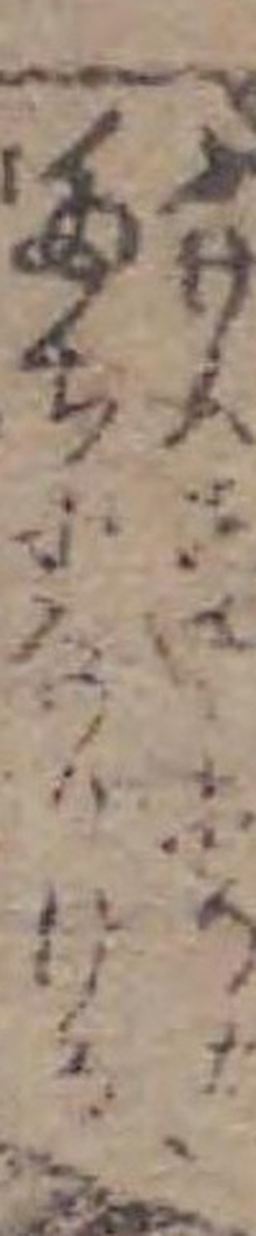たちになりける
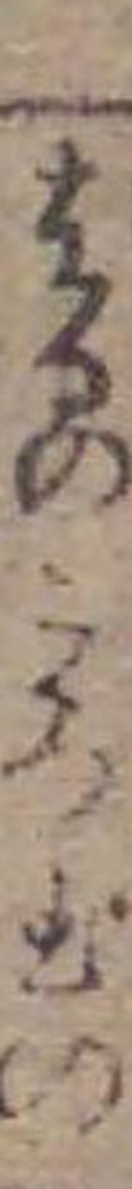はるのころ玉の
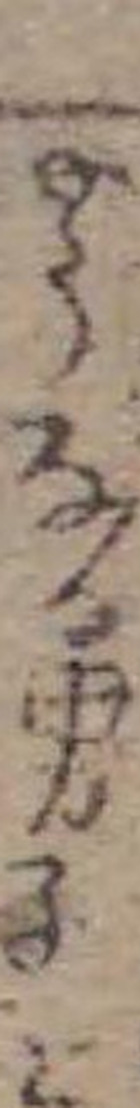やうなる男子を
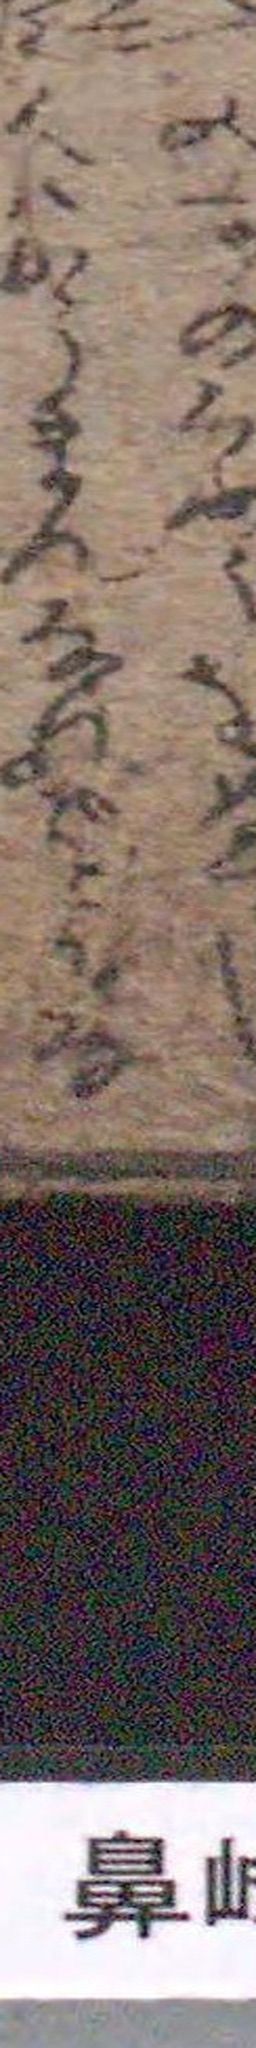人はかうまんなればはな
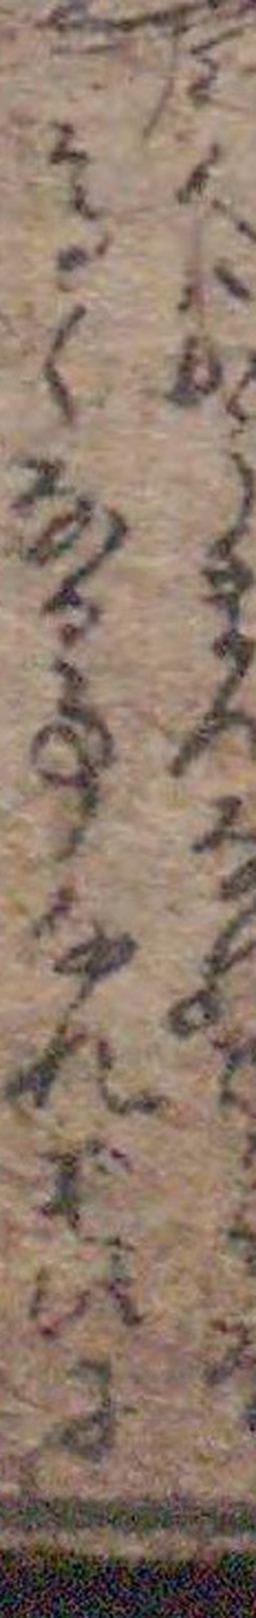高くなる事なれば此子
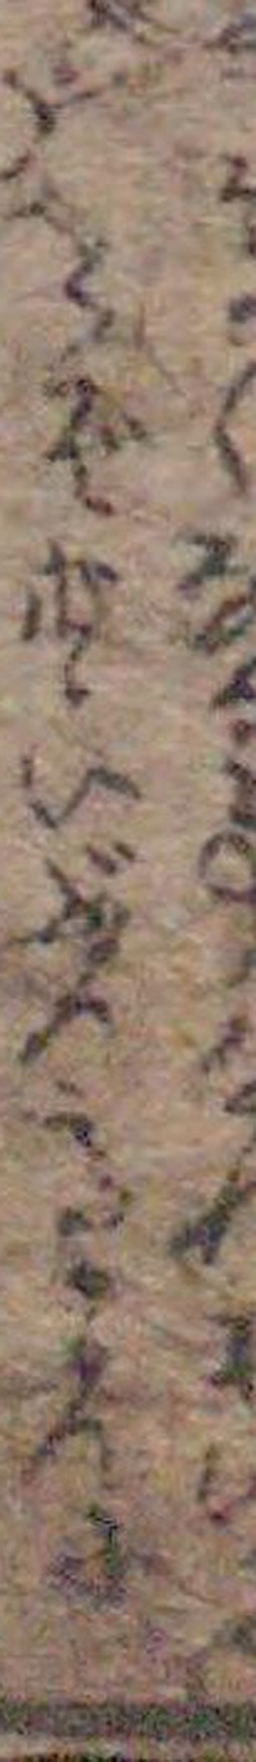をぞずいぶん高まんに
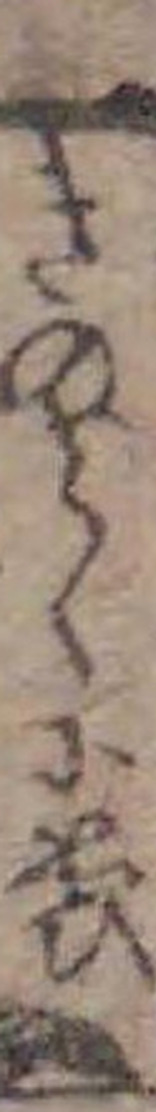きのとくに思ひ
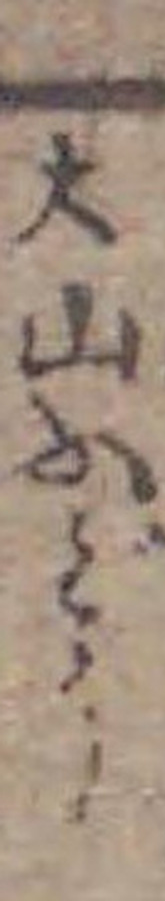大山ふどう
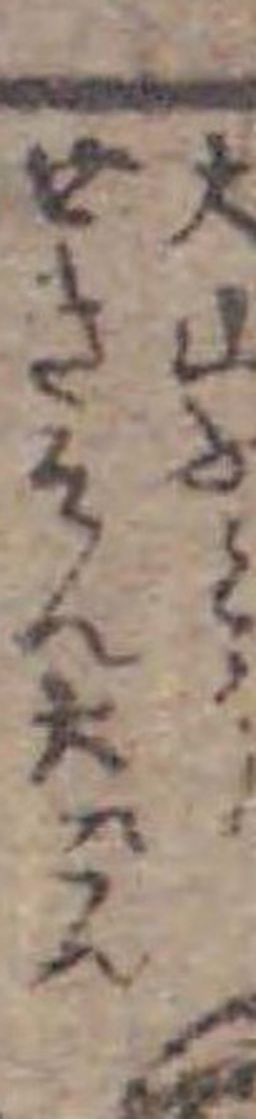せきそん大ごん
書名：鼻峰高慢男 : 2巻
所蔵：国立国会図書館 National Diet Library, JAPAN
